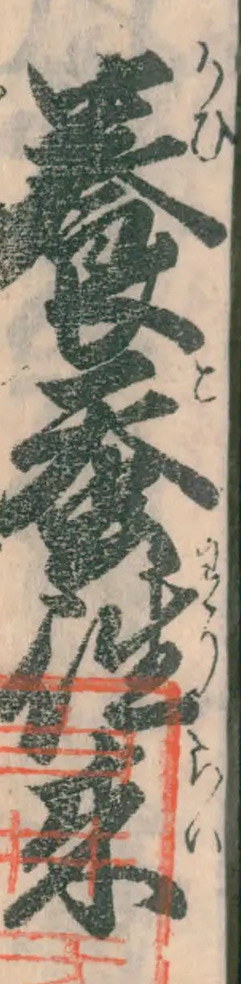養蚕往来
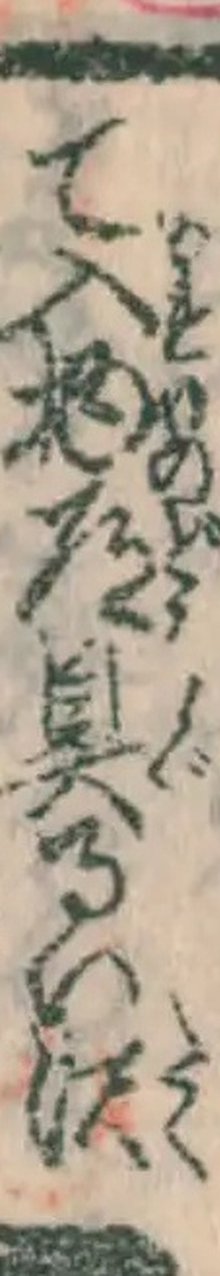て入物道具るい沢
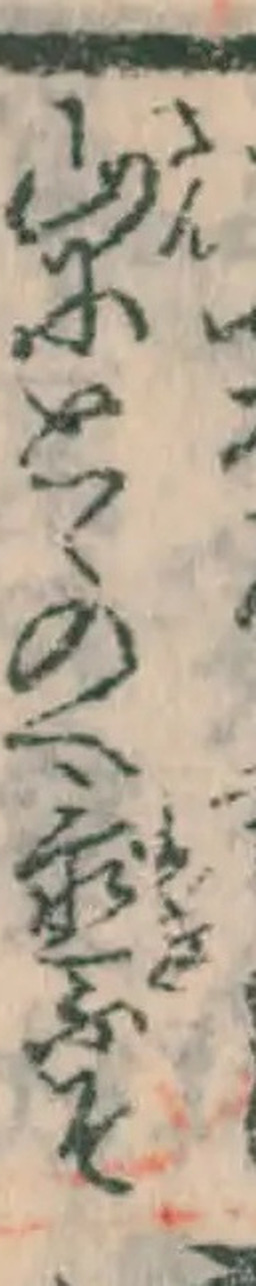山にとゝのへ置ふそ
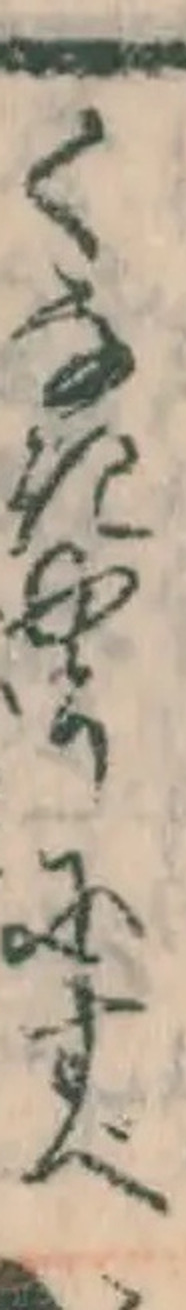くなきやうにすべ
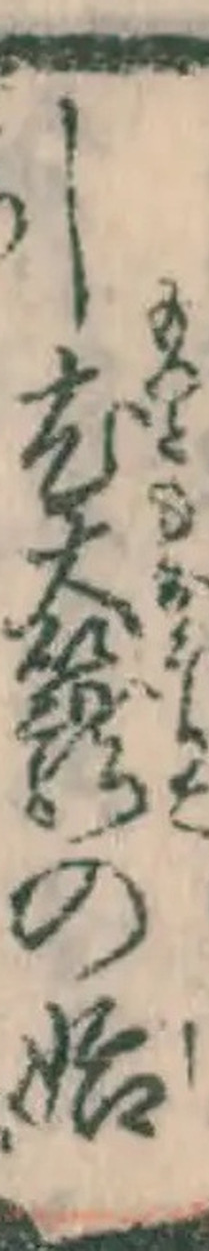し尤大籠の始
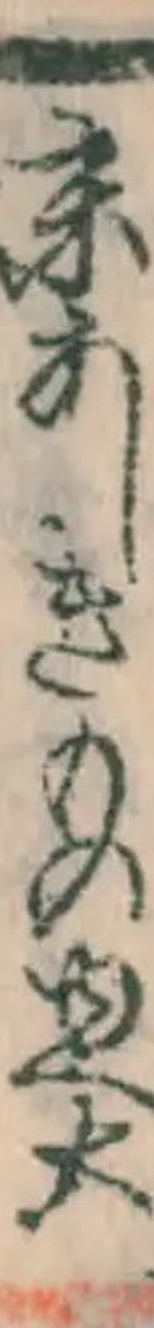末あしきものゆへ大
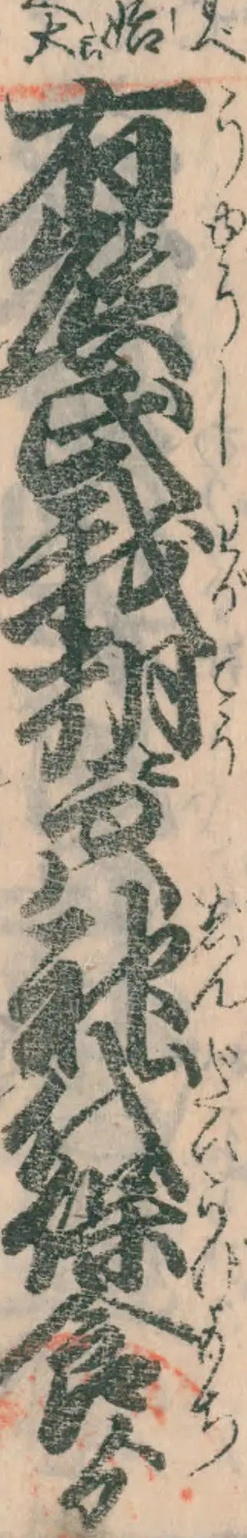有熊氏我朝にては神代保食ゟ
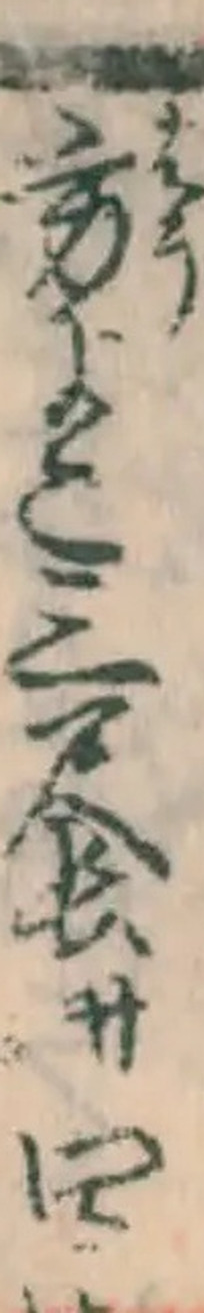方よこ三尺長サ四
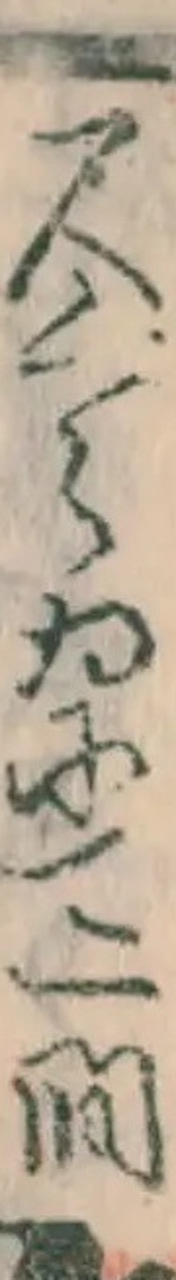尺くらゐにて一間
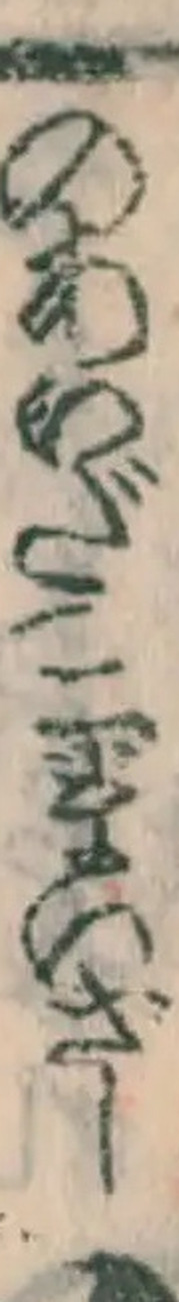のあいだへ二まいざし
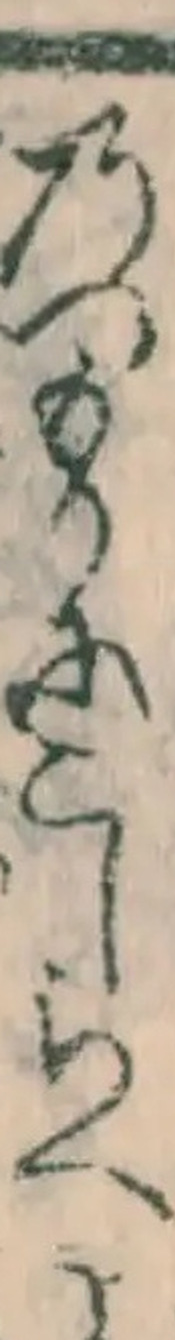乃つもりにこしらへ
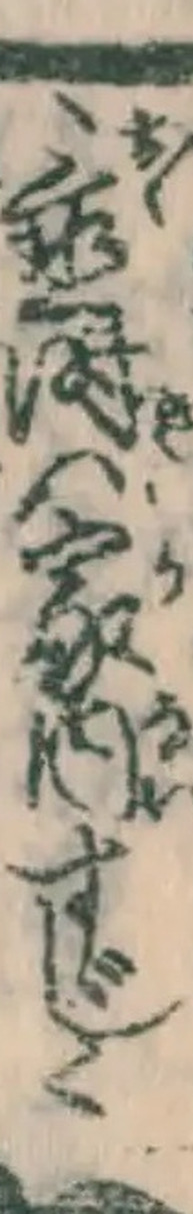置時は家内すゞしく
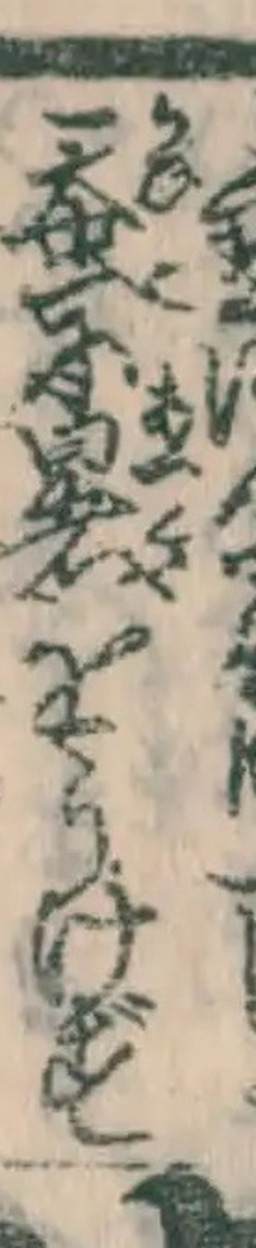蚕に暑をかけず
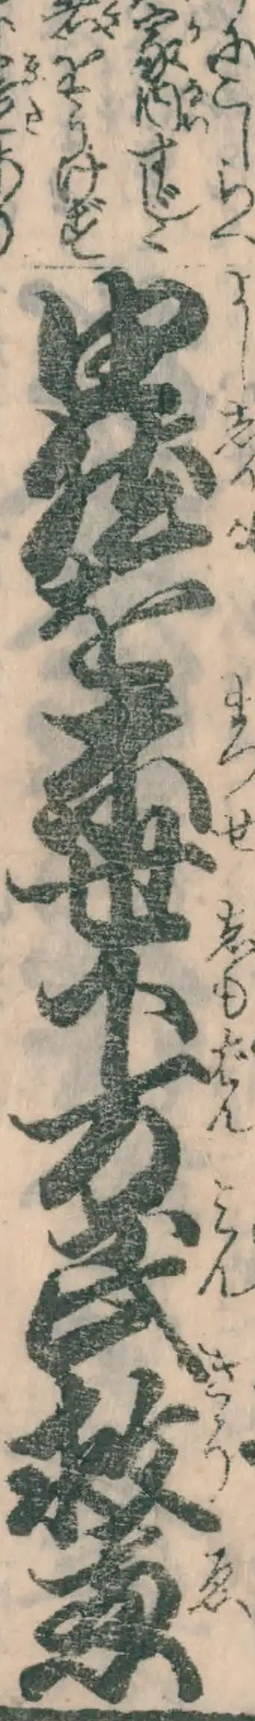由然を末世下万民救恵
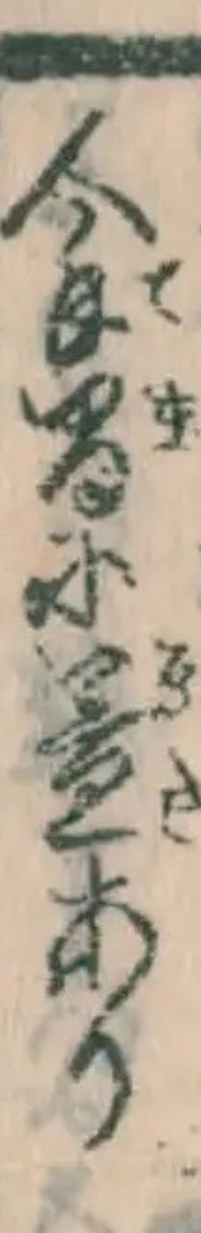人手間に益あり

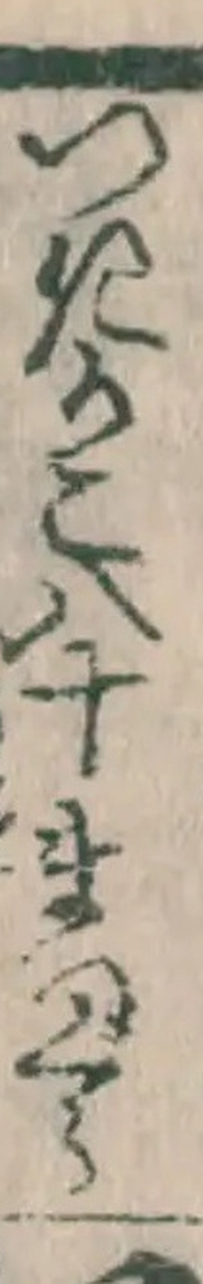つきかご八十まいくら
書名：養蚕往来
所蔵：国立国会図書館 National Diet Library, JAPAN
